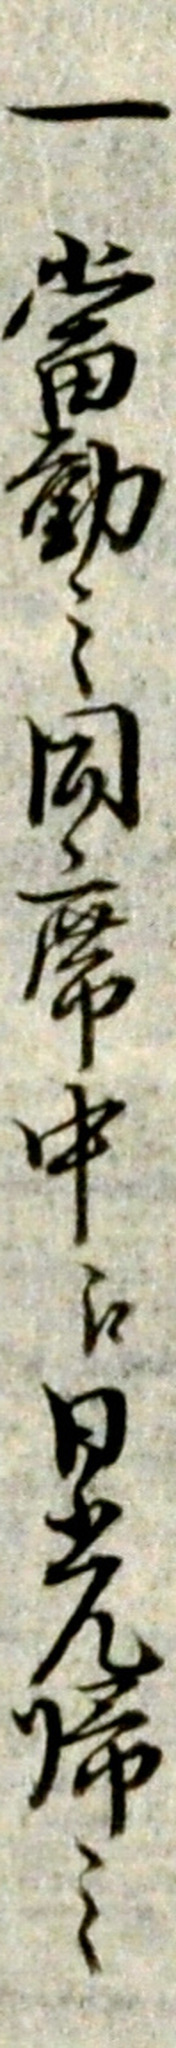一当勤之同席中江日光帰之
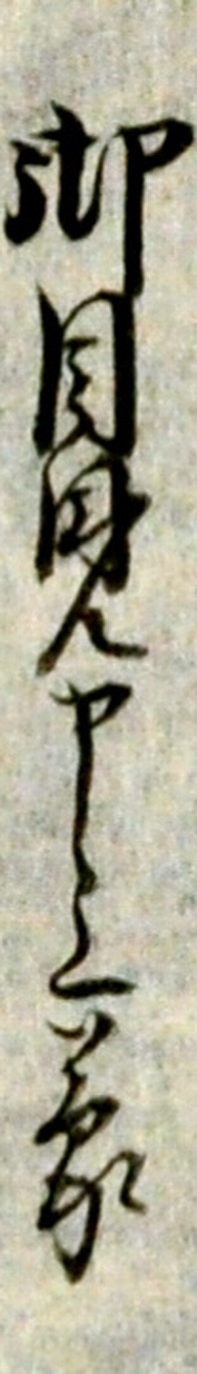御目見申上蒙
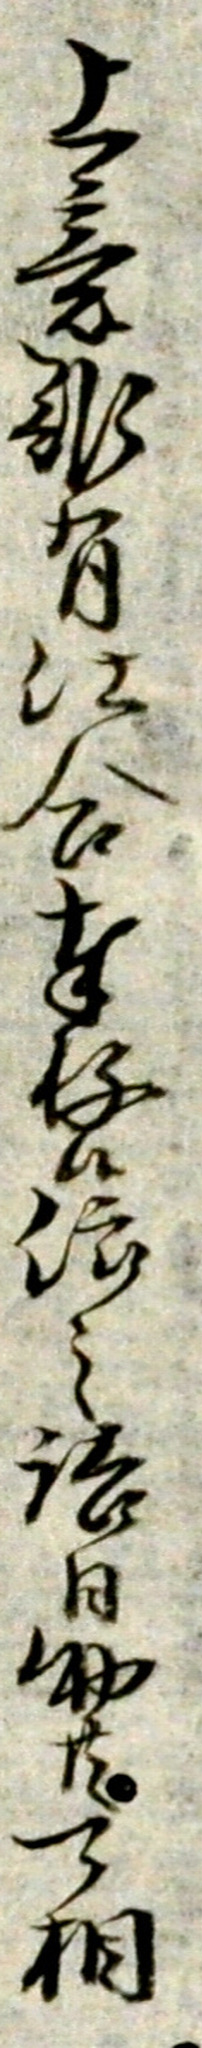上意難有仕合奉存候依之詰日助共可相
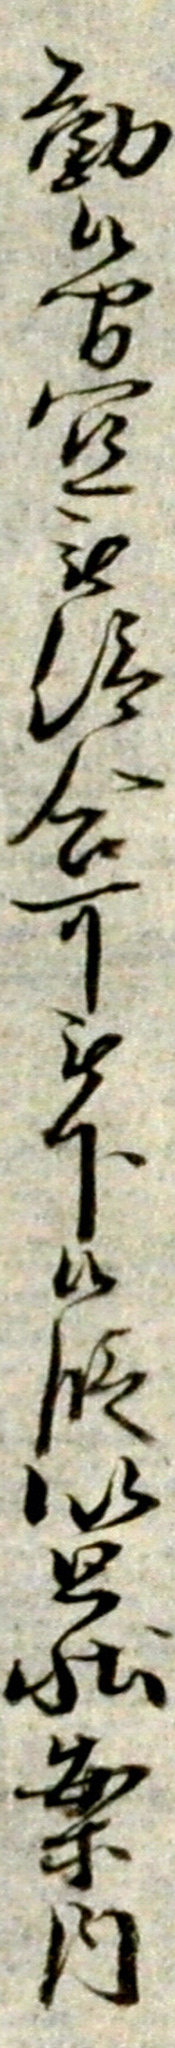勤候間宜被仰合可被下候段以廻状案内
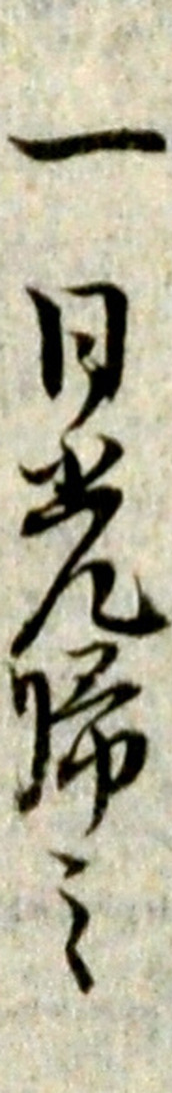一日光帰之
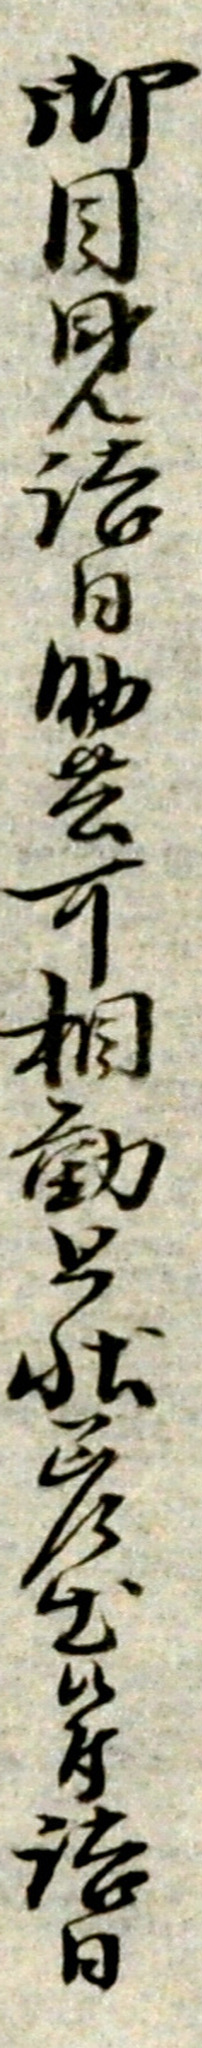御目見詰日助共可相勤廻状差出候付詰日
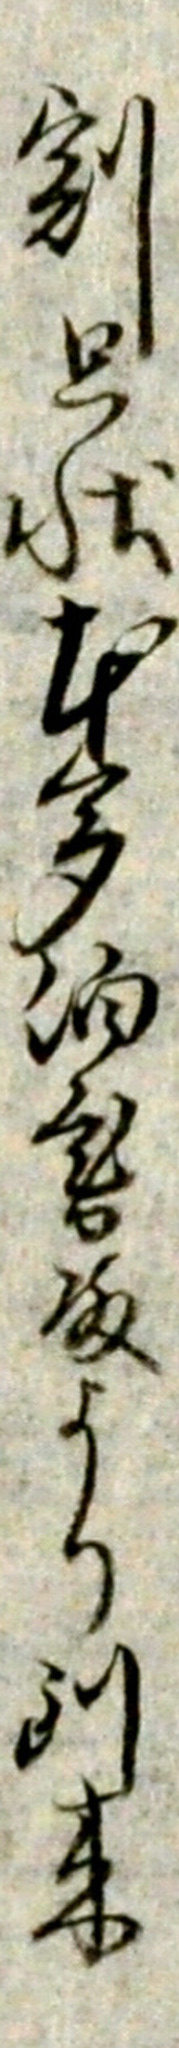割廻状本多伯耆殿より到来
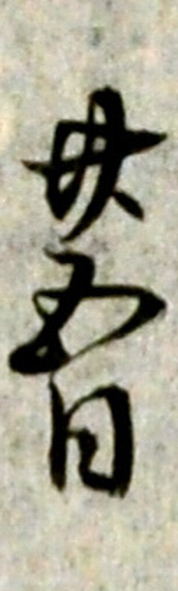廿五日
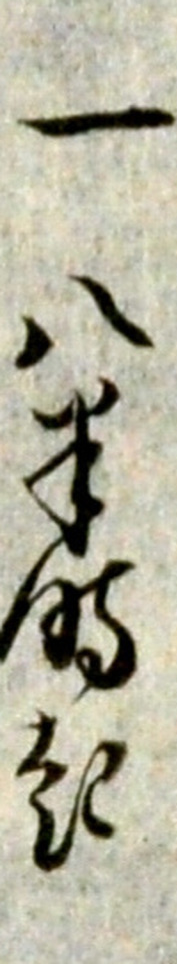一八半時起
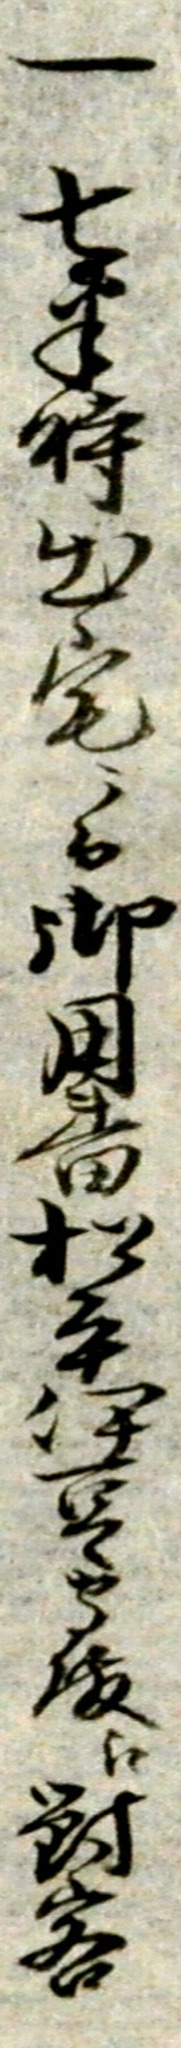一七半時出宅ニ而御用番松平伊豆守殿江対客
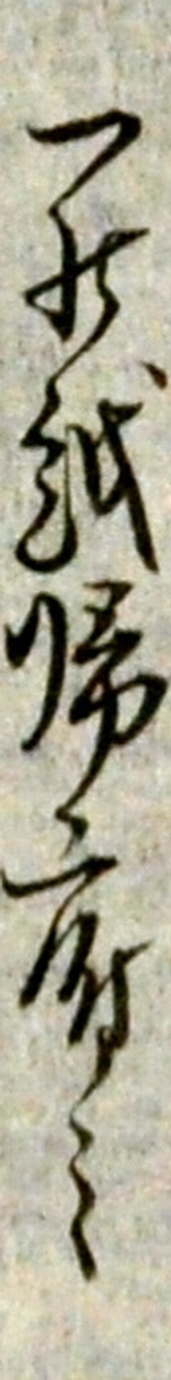罷越帰府之
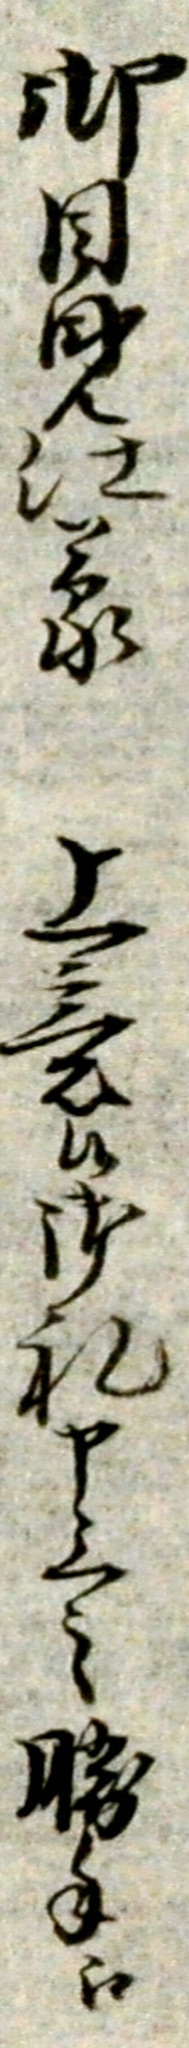御目見仕蒙上意候御礼申上之勝手江
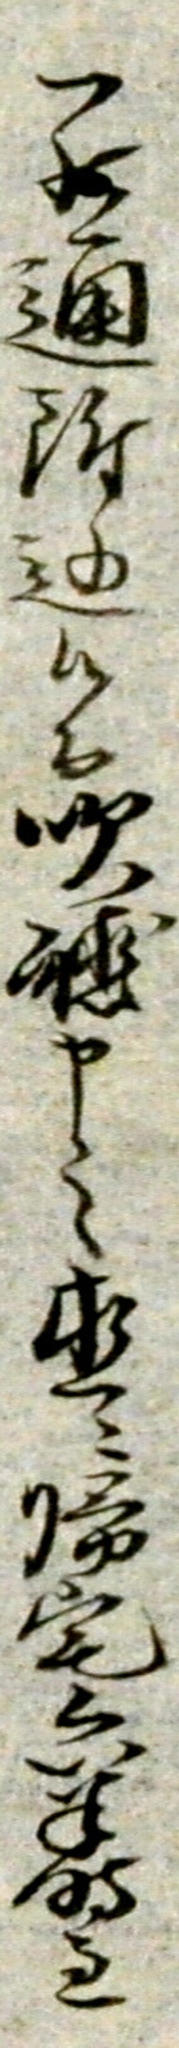罷通附込候而吹聴申之直ニ帰宅六半過
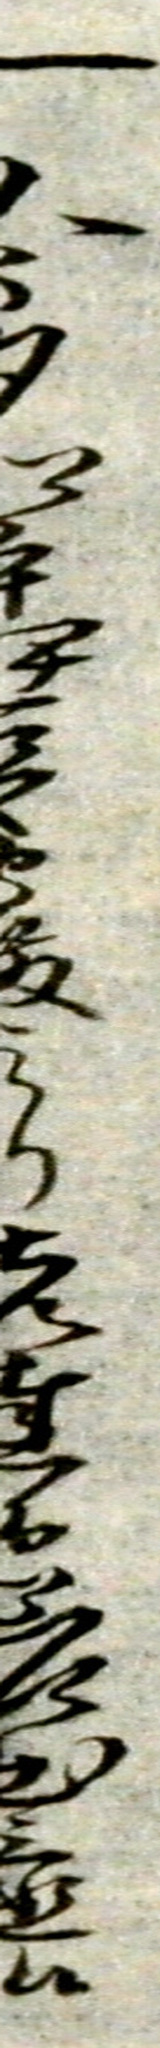一今夕松平伊豆守殿より先達而差出置候

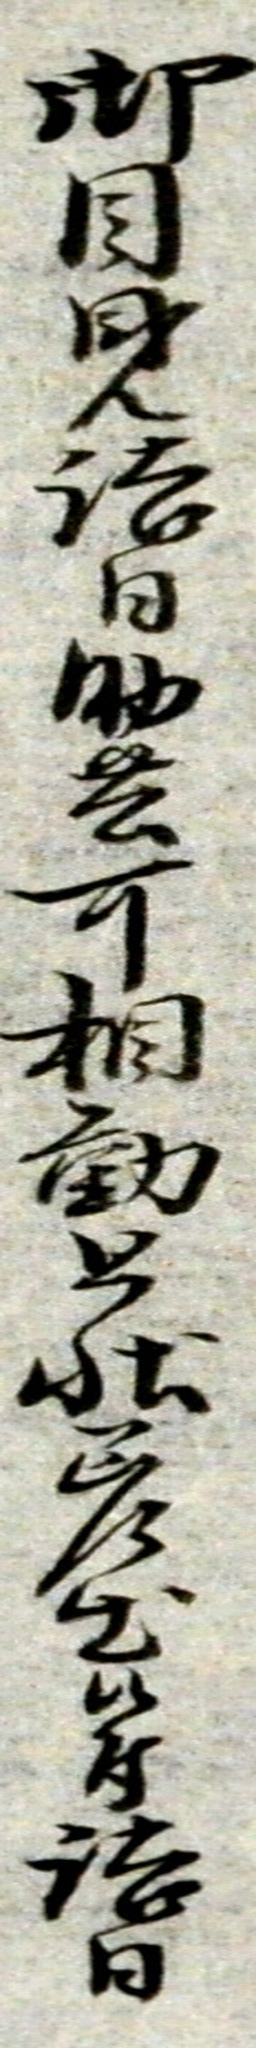御目見詰日助共可相勤廻状差出候付詰日
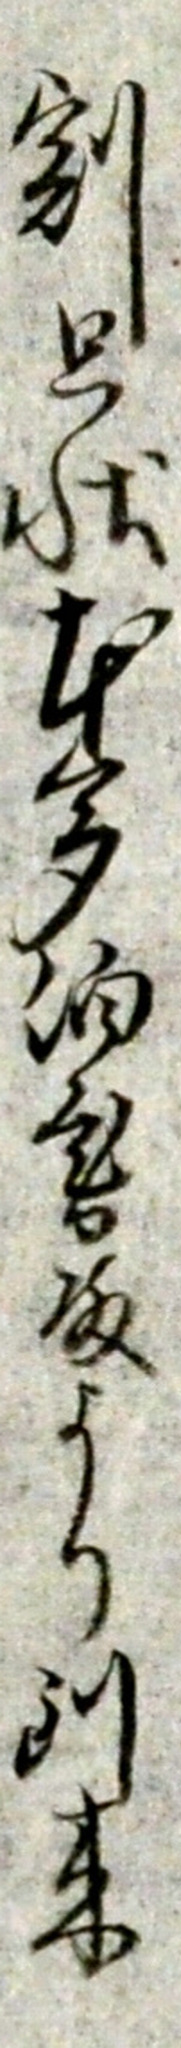割廻状本多伯耆殿より到来
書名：日光御名代相勤候節ノ留
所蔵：伊那市立高遠町図書館・合同会社AMANE
